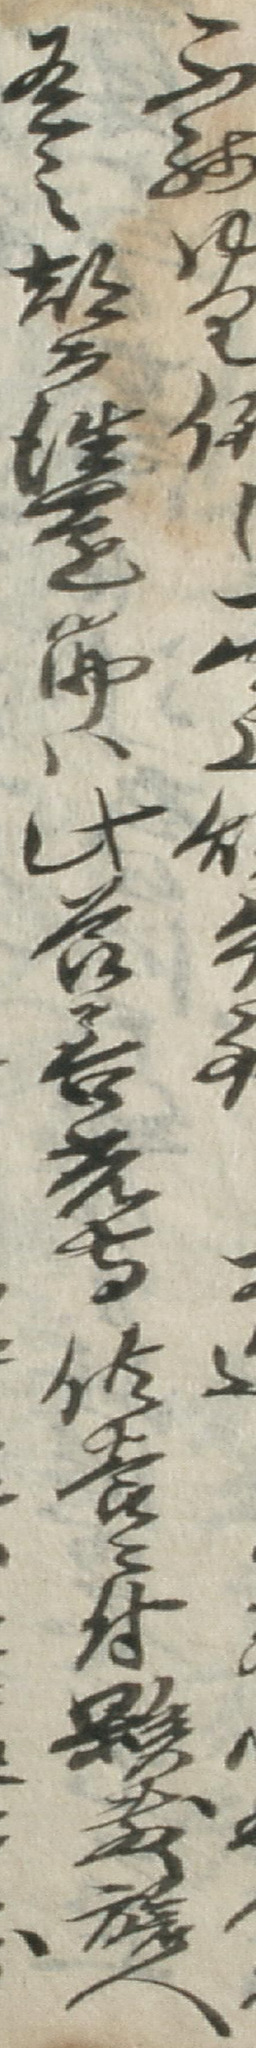有之都而往還筋ハ此節善光寺供養ニ付夥敷旅人
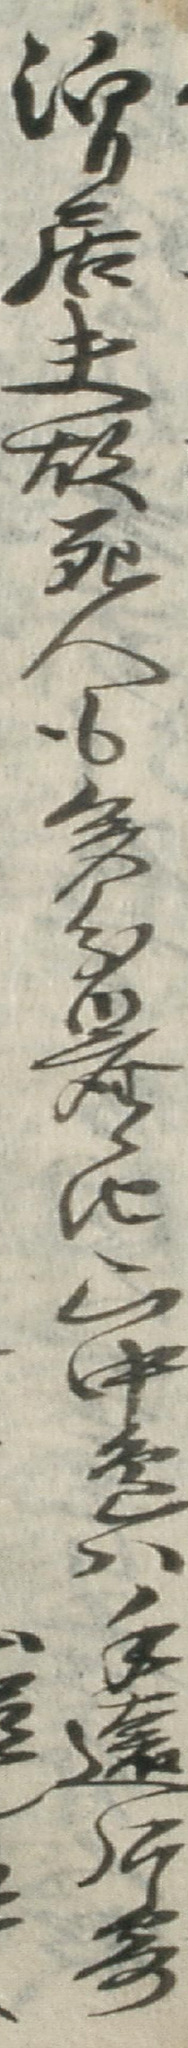泊り居夫故死人も多分御座候由山中辺ハ手遠片寄
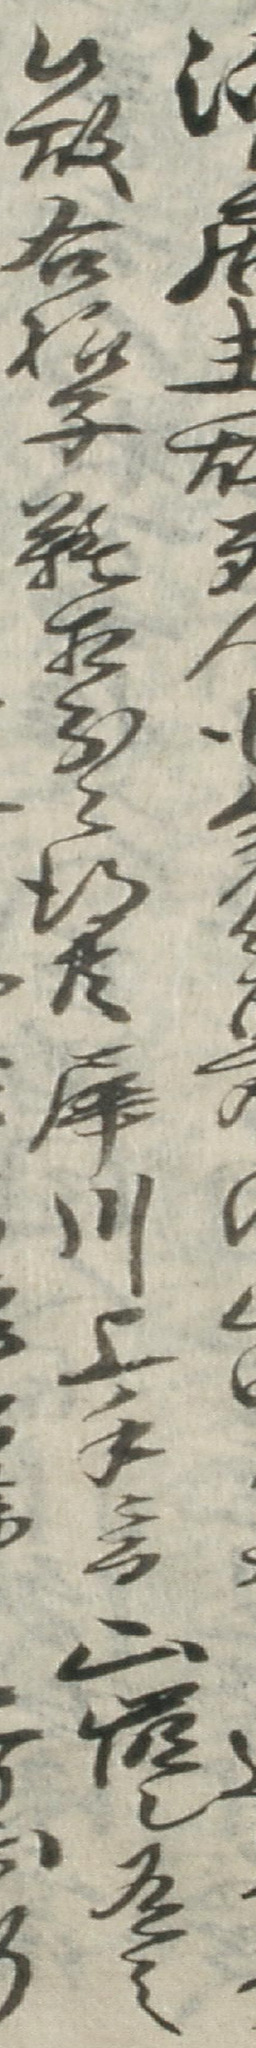候故右様子難相分候得共犀川上手二而山崩レ有之
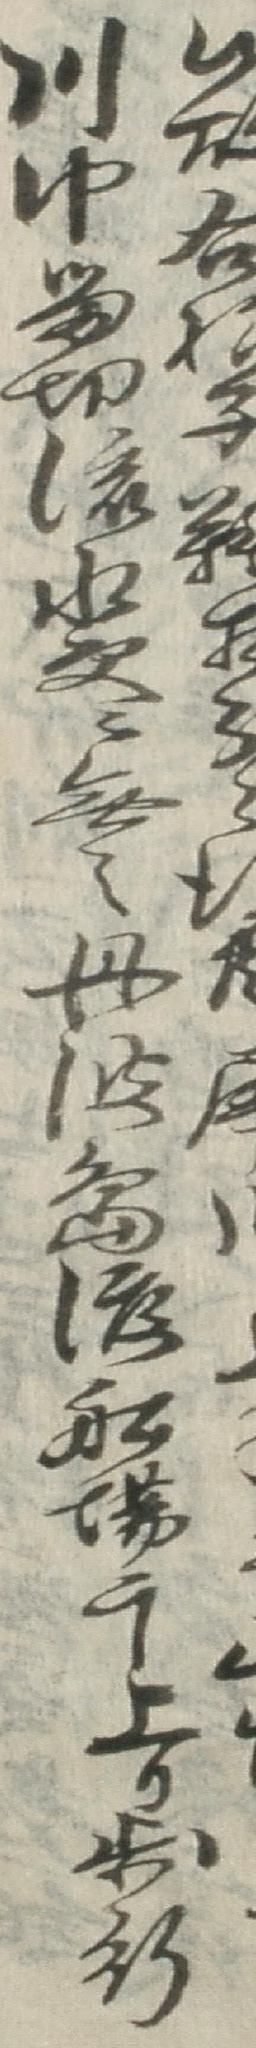川巾留切流水更二無之丹波嶋船場干上り歩行
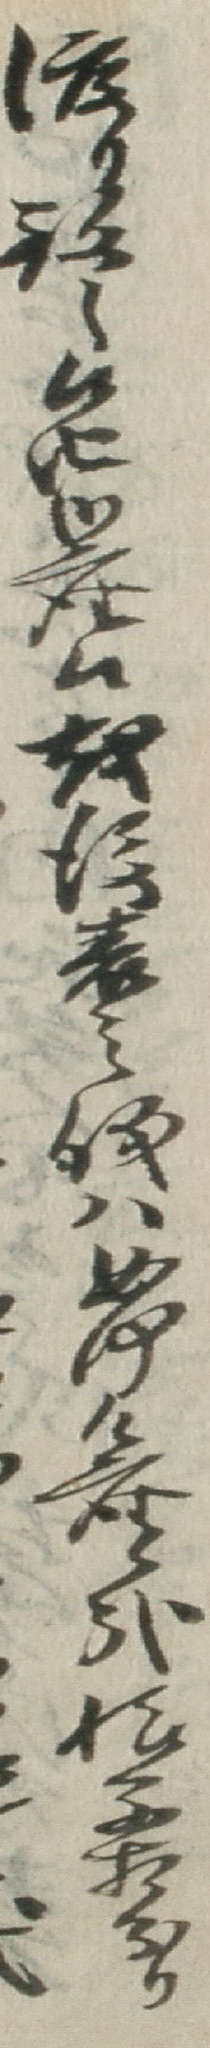渡り致し候由御座候越後表之儀ハ如何御座候哉様子相分り
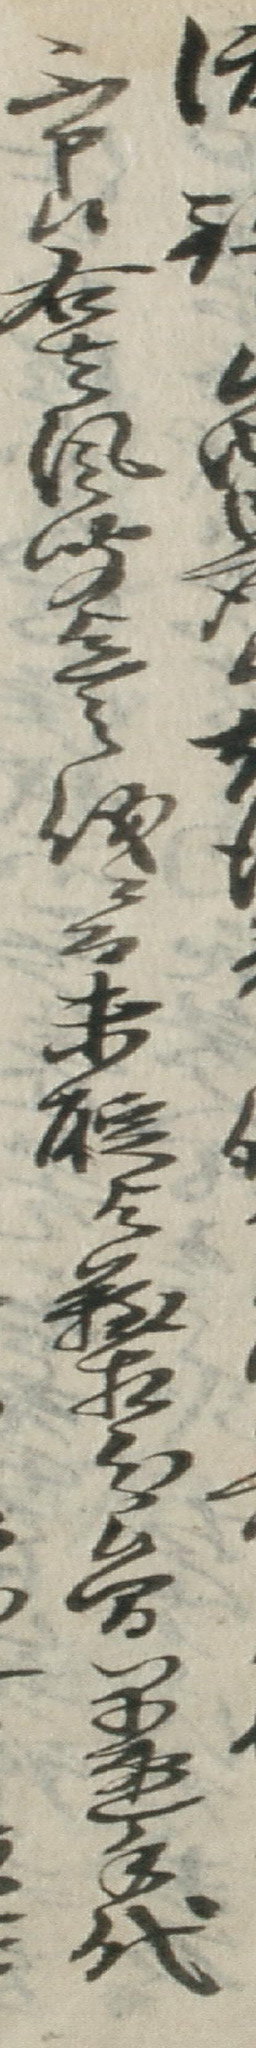不申候右は風聞迄之儀二而未聢と難相分候間早速手代
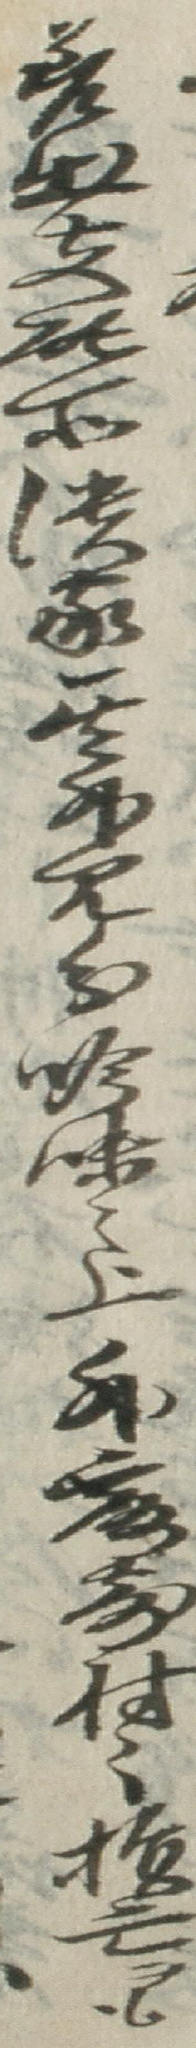差出支配所潰家其外見分吟味之上外最寄村々損亡ヲも
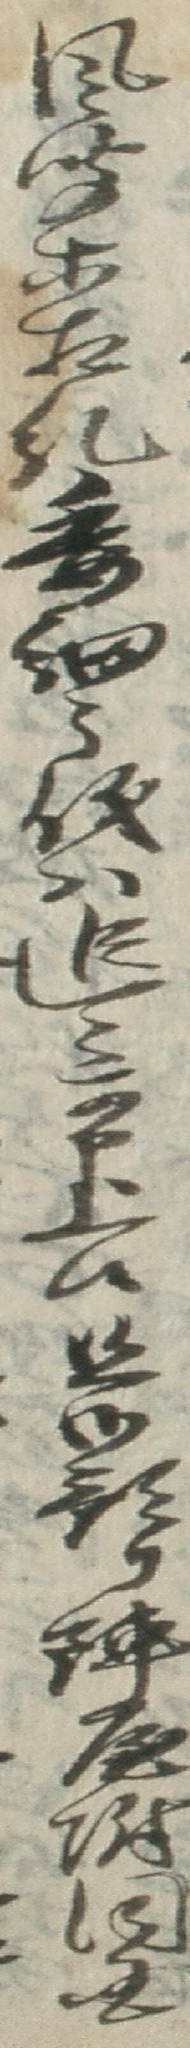風聞等相糺委細之儀ハ追々可申上候且御預り陣屋付同国
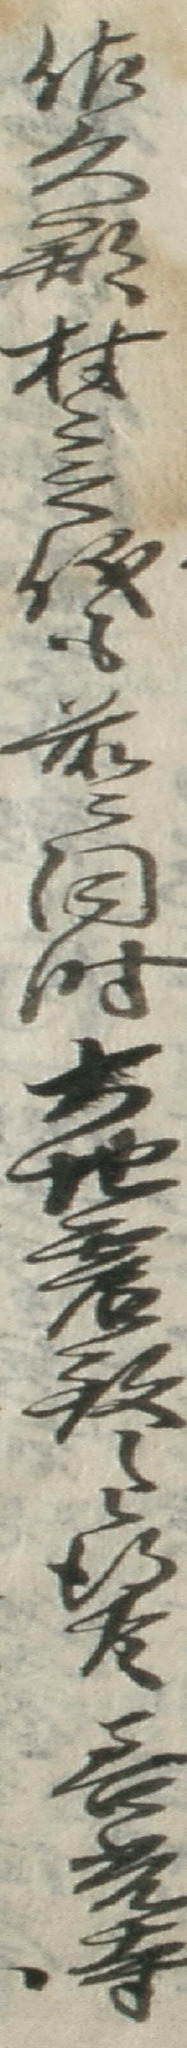佐久郡村々之儀も前々同時大地震致し候得共善光寺
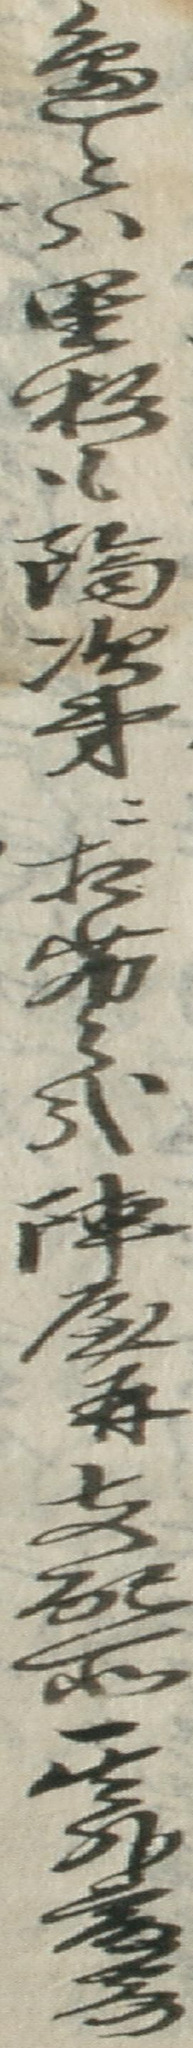辺とハ里数も隔次第二相劣候哉陣屋并支配所其外最寄
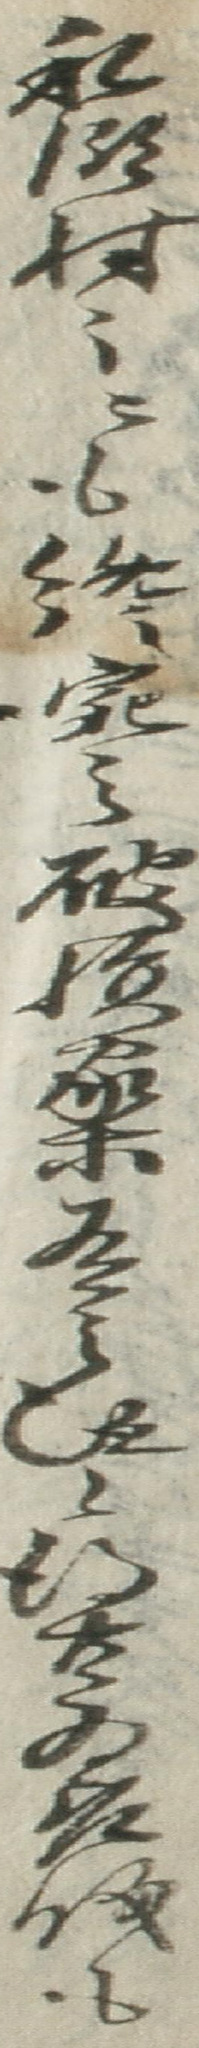私領村々二も纔宛之破損家等有之趣候得共為差儀も
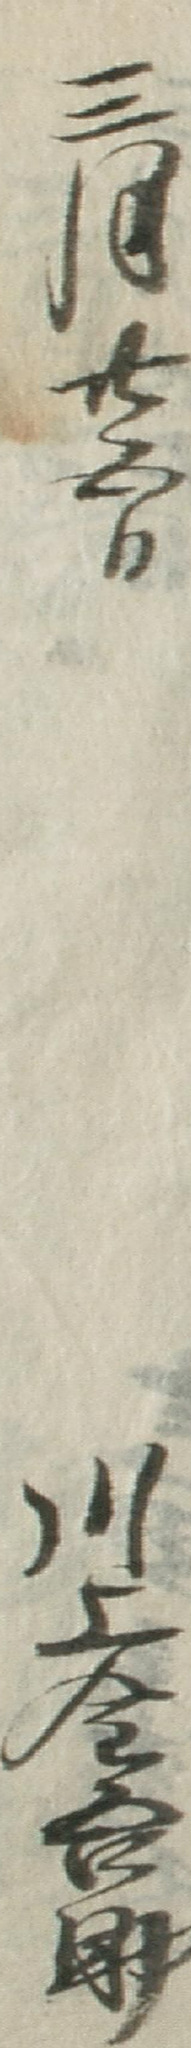三月廿五日川上金吾助
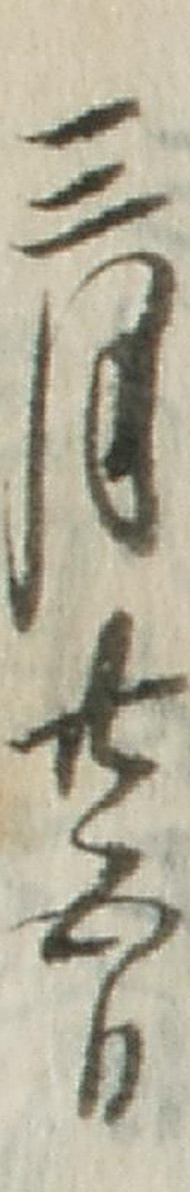三月廿六日
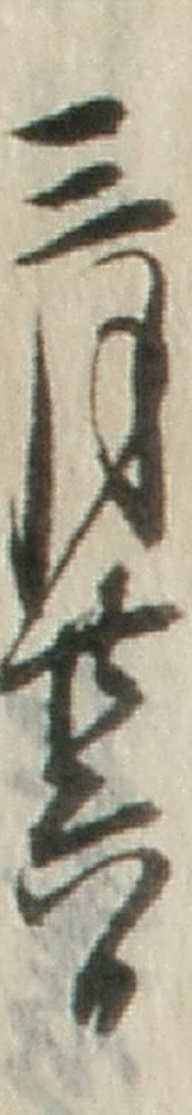三月廿六日
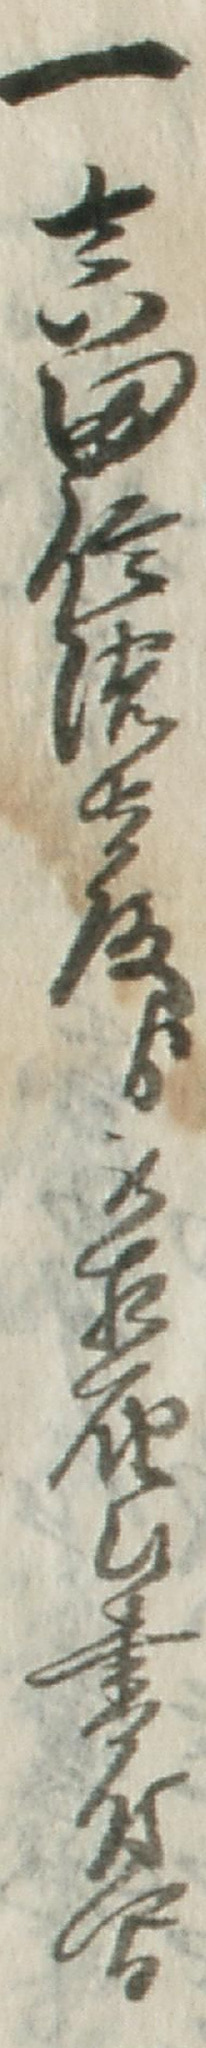一真田信濃守殿ゟ被相届候書付写
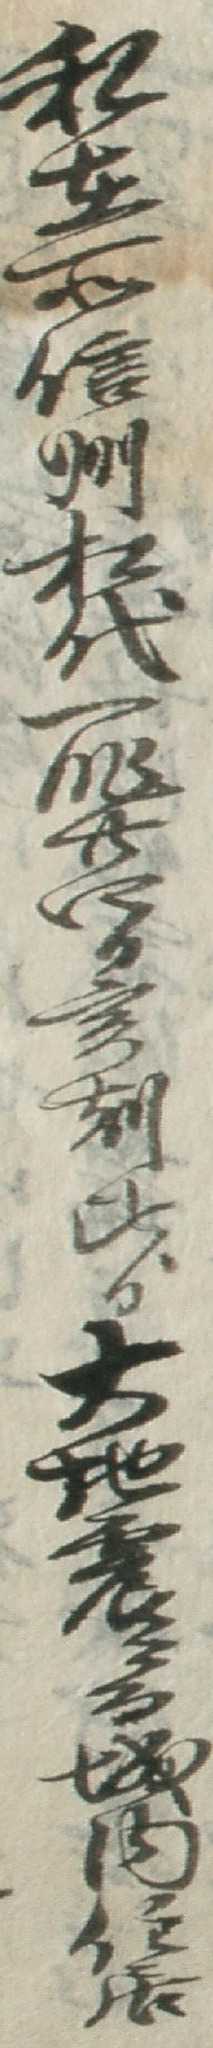私在所信州松代一昨廿四日亥刻比ゟ大地震二而城内住居
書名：信濃國地震實録記
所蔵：東京大学地震研究所図書室 Earthquake Research Institute Library, The University of Tokyo, JAPAN
